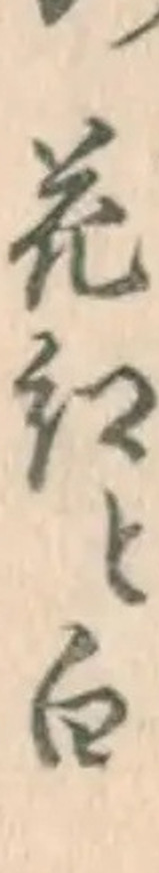花紅と白
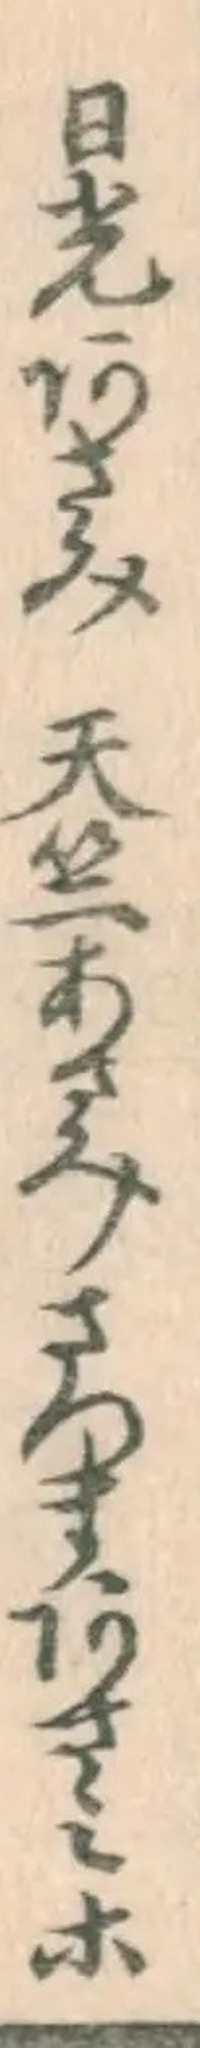日光あさみ天竺あさみさつまあさミ
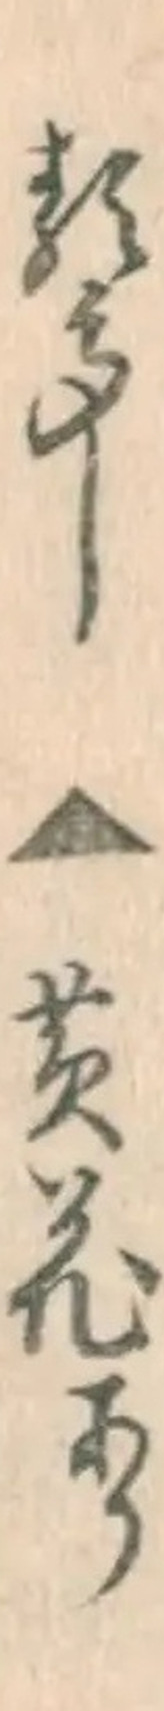類多し▲黄花あり
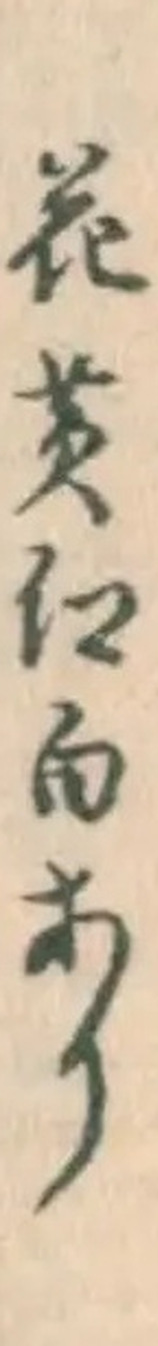花黄紅白あり
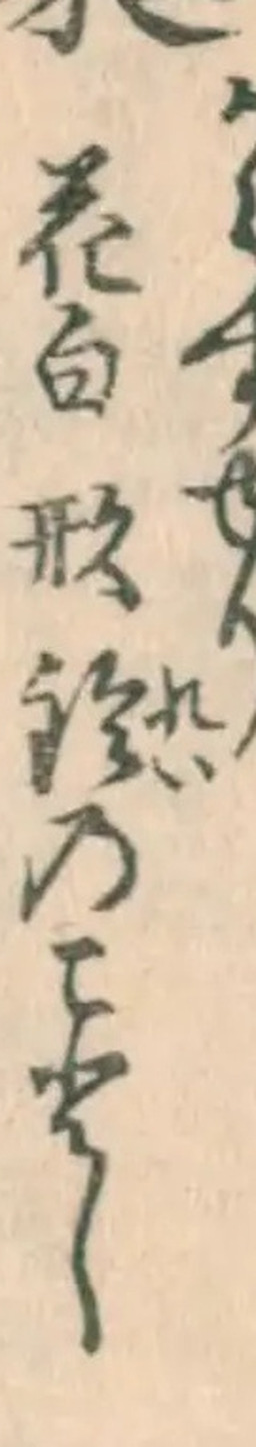花白形鈴のことし
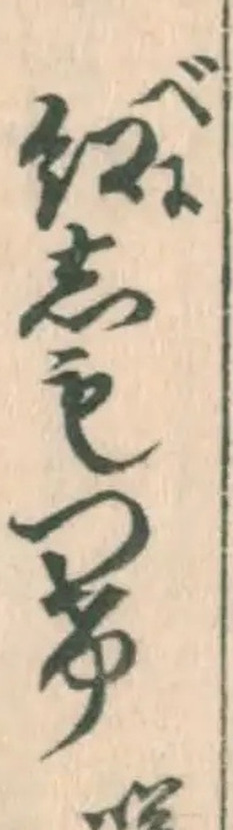▲岩しもつけ
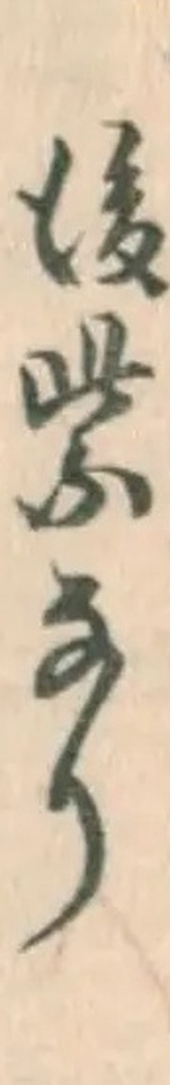後紫なり
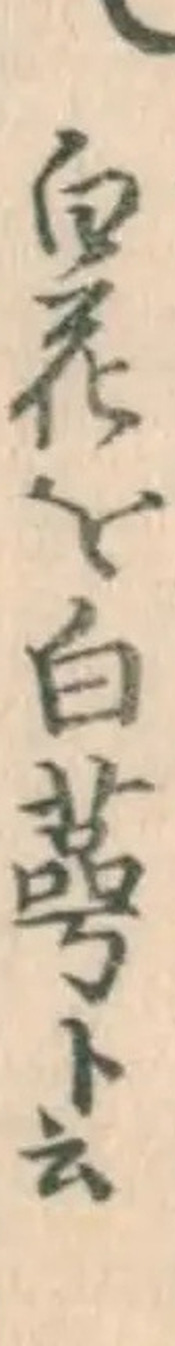白花を白萼と云
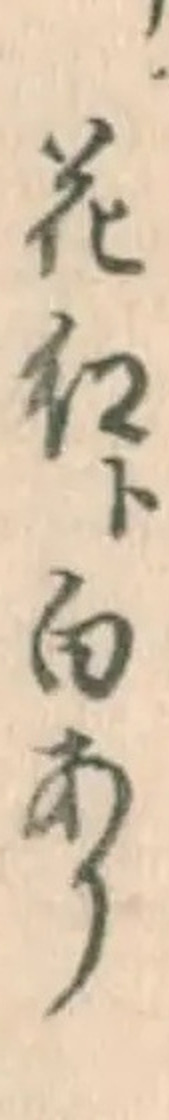花紅と白あり
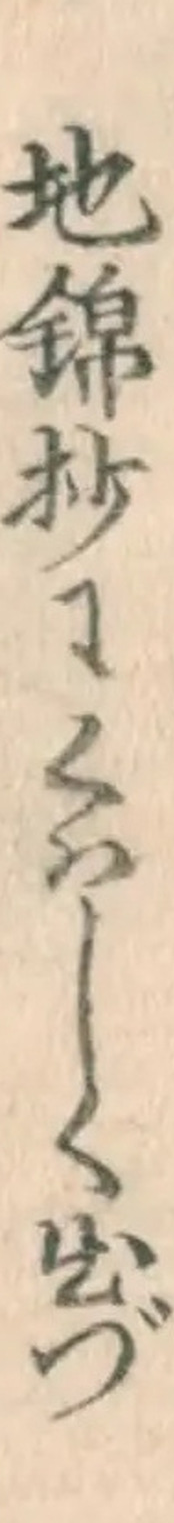地錦抄にくハしく出づ
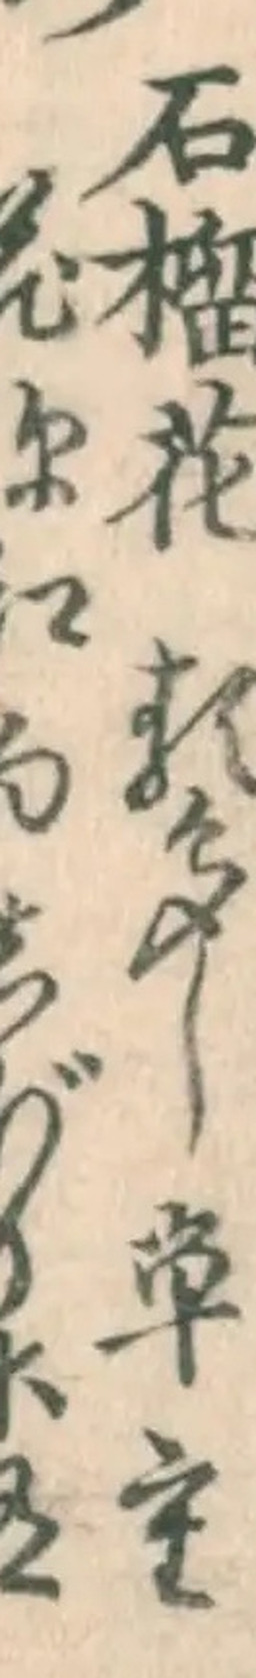花深紅白しぼり木有
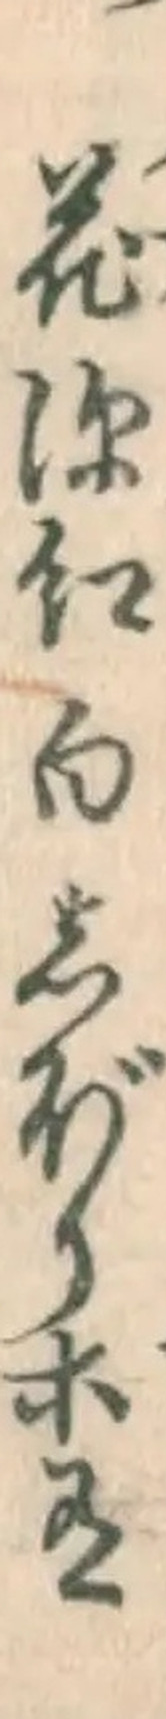花深紅白しぼり木有
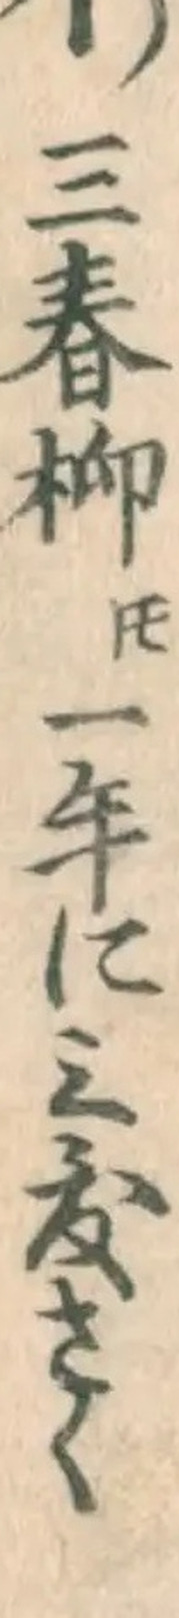御柳三春柳共一年に三度さく
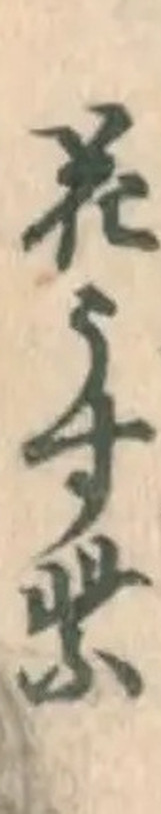花うす紫
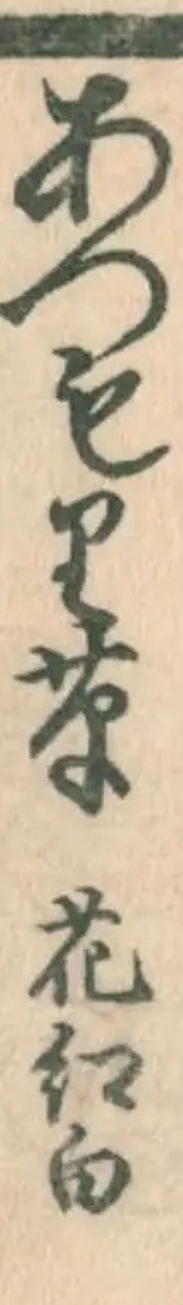あつもり草花紅白

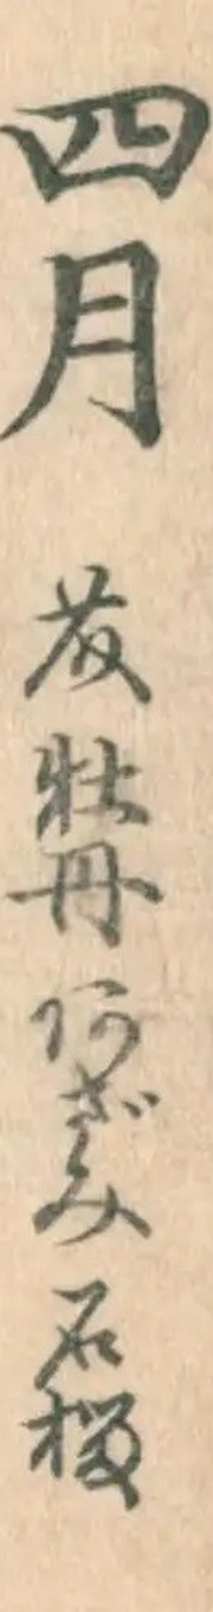四月藤牡丹あざみ石榴
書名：茶席挿花集
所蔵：国立国会図書館 National Diet Library, JAPAN
